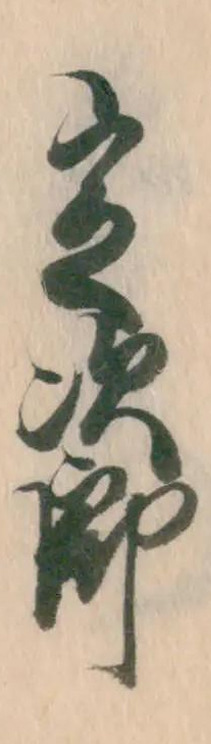定次郎
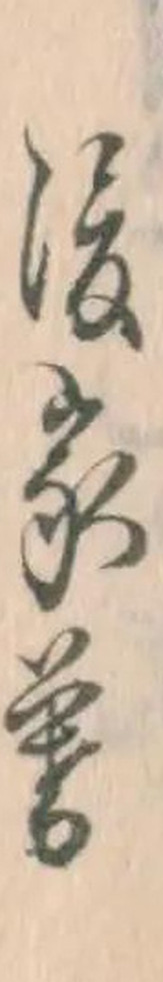後家暮
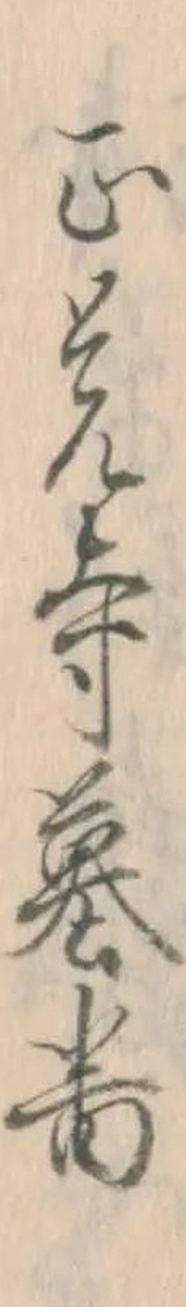正覚寺墓番

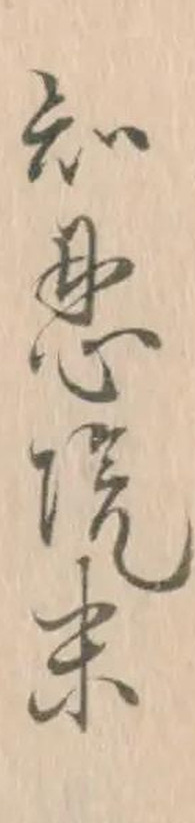知恩院末
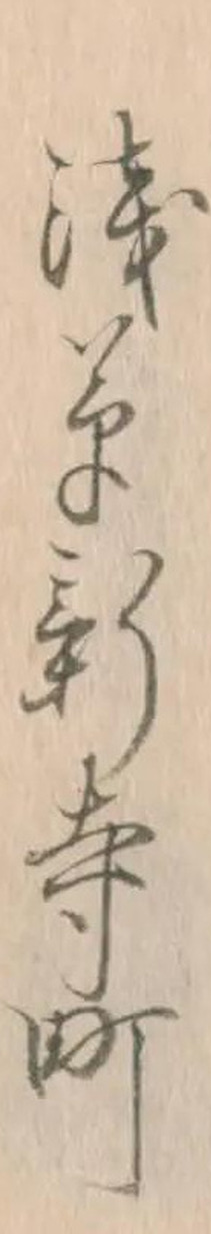浅草新寺町
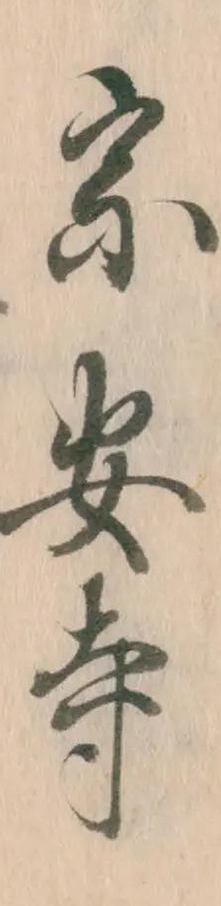宗安寺
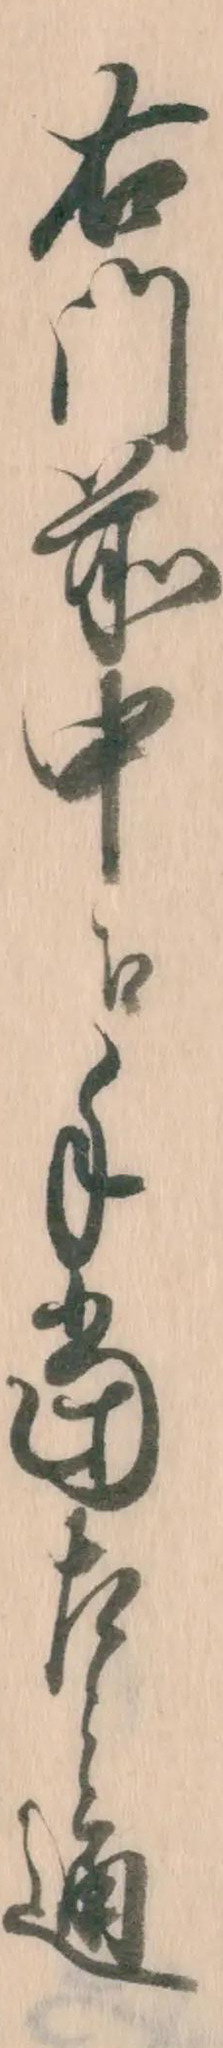右門前中え手当左之通
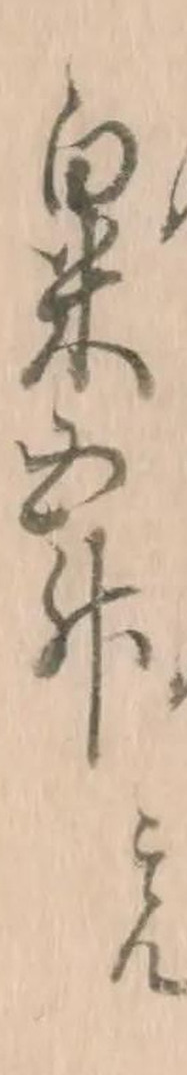白米五升宛
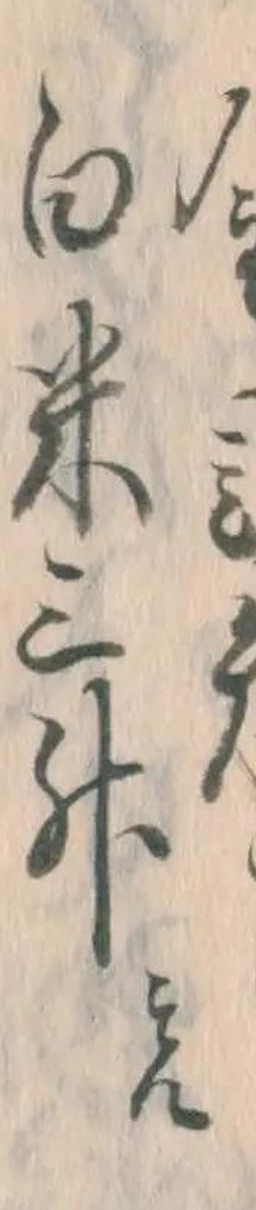白米三升宛

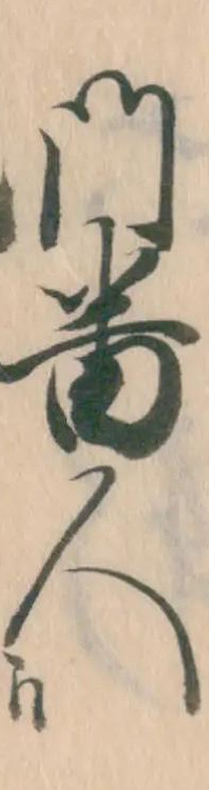門番人
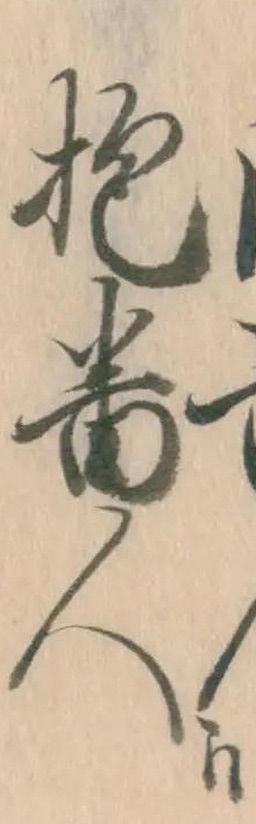門番人
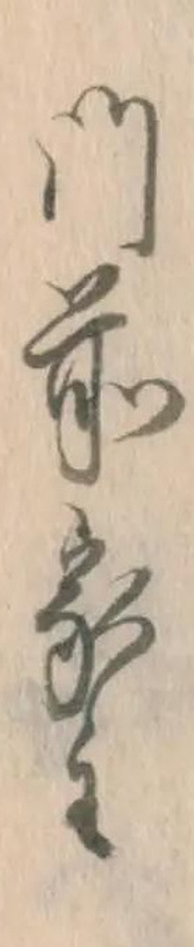門前家主
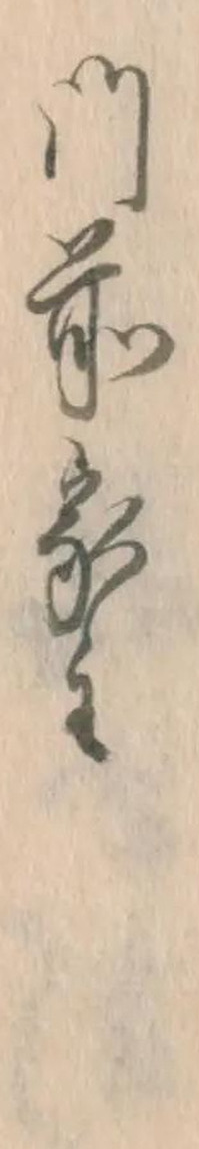門前家主
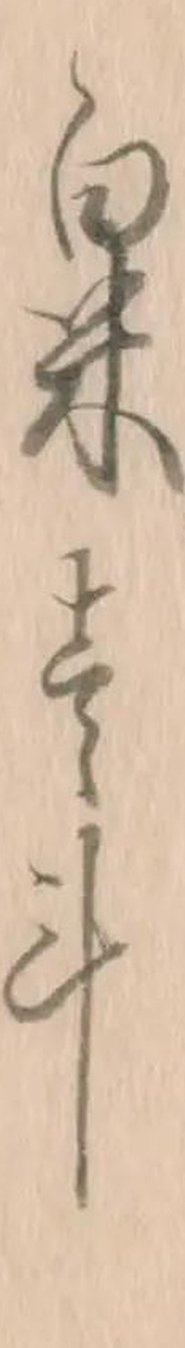白米壱斗
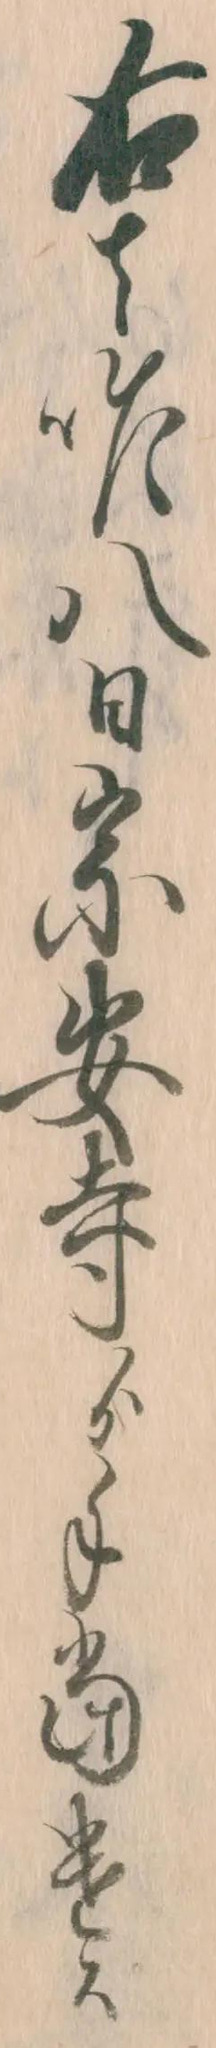右は昨八日宗安寺ゟ手当遣ス
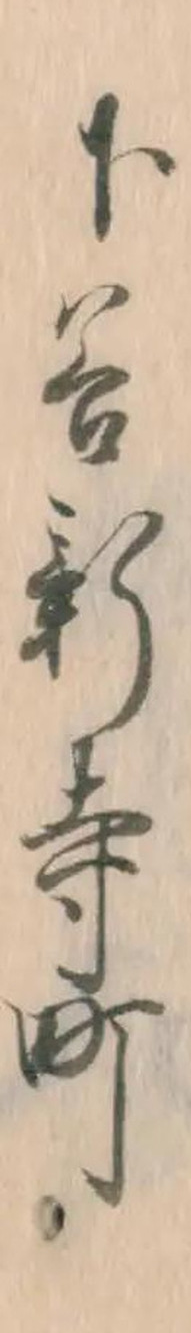下谷新寺町
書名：武家方并寺院等ニテ施差出候一件
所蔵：国立国会図書館 National Diet Library, JAPAN
